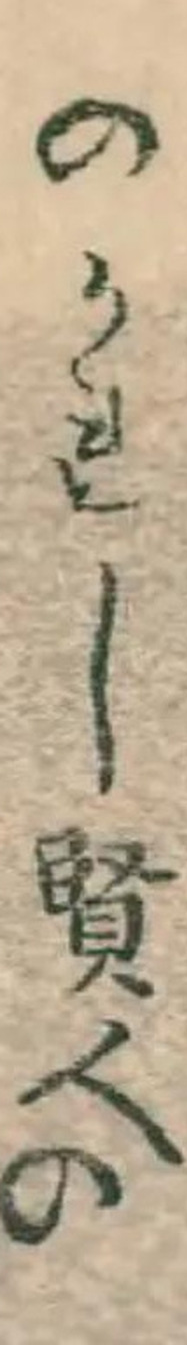のかれし賢人の
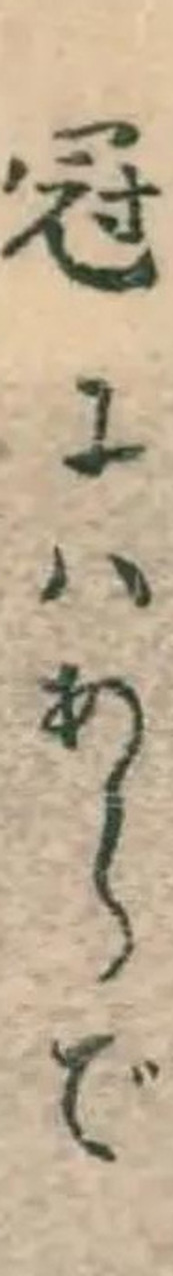冠にはあらで
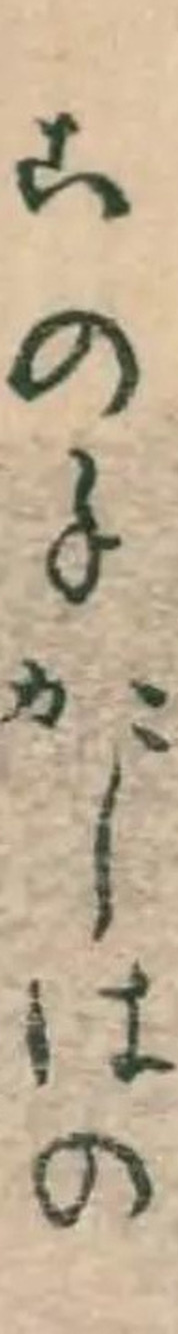このてかしはの
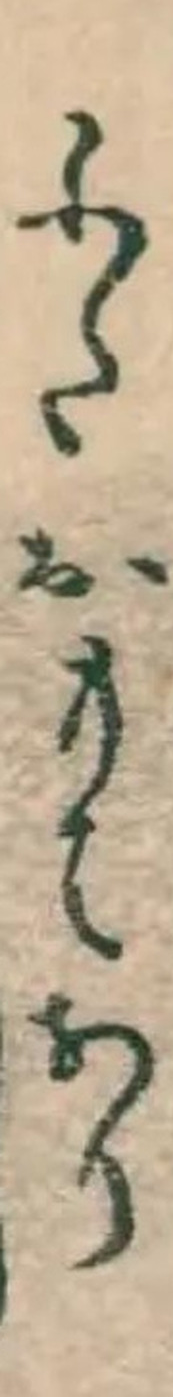ふたおもてありし
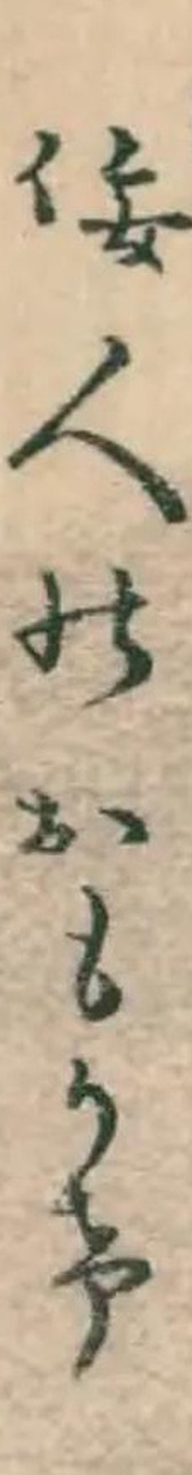侫人のおもかけ
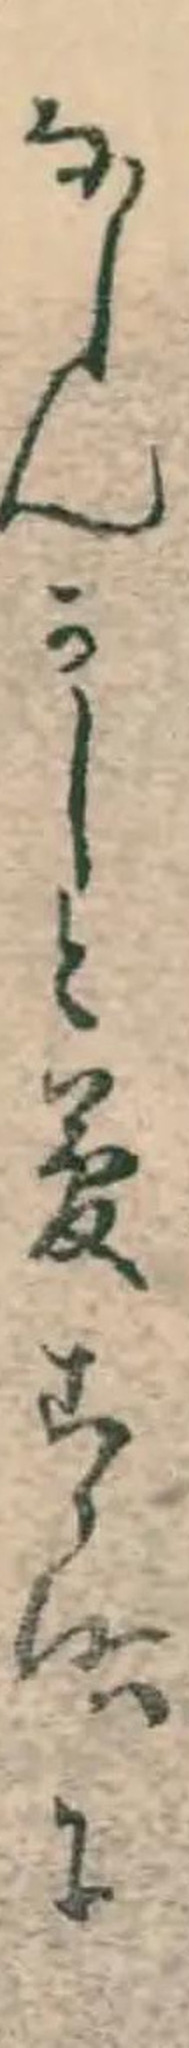ならんかしと夢こゝちに
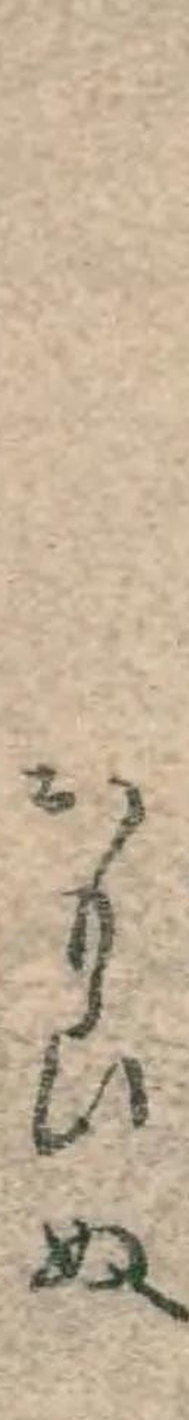おもひぬ
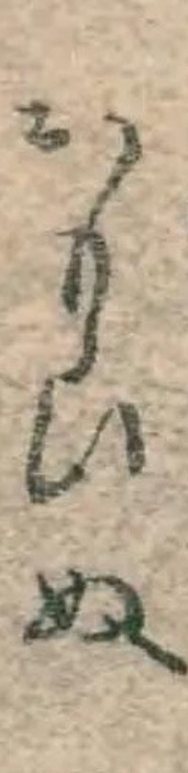おもひぬ
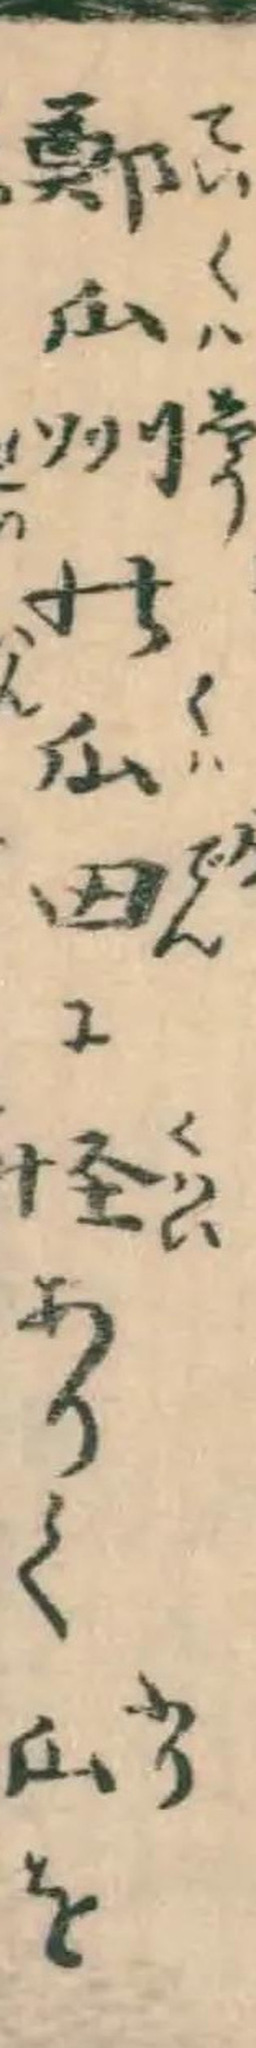鄭瓜州の瓜田に怪ありて瓜を
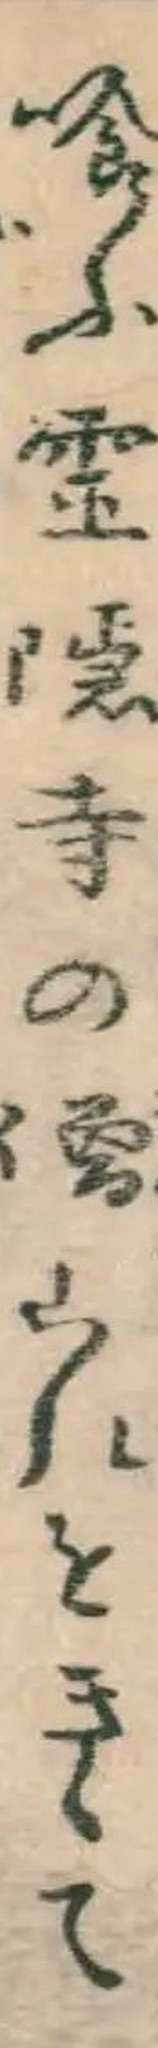喰ふ霊隠寺の僧これをきゝて
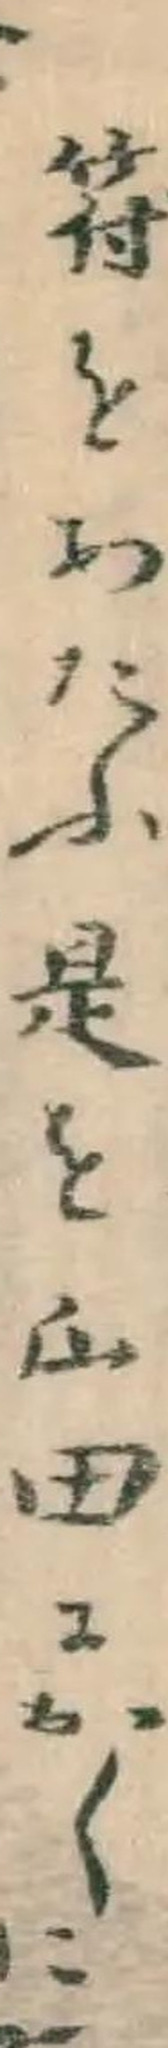符をあたふ是を瓜田におくに
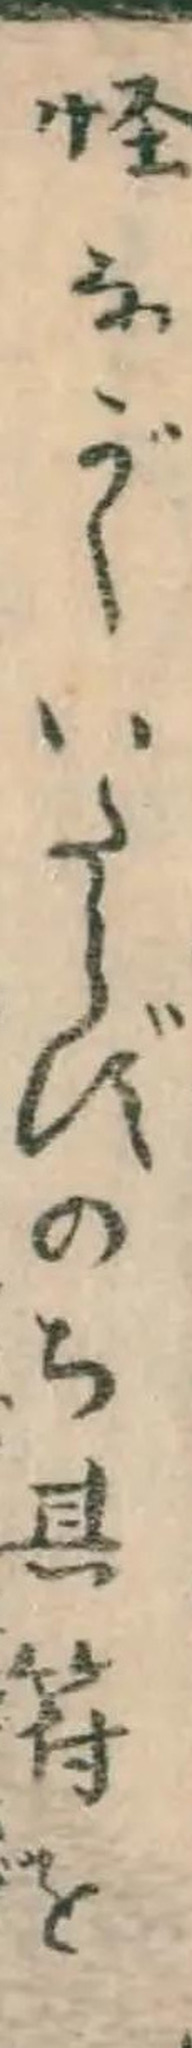怪ながくいたらずのち其符を
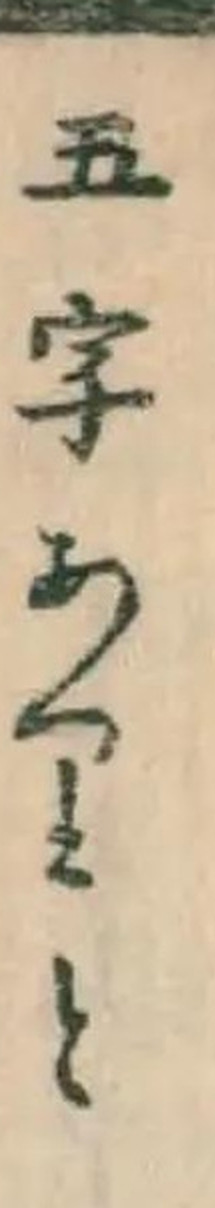五字ありと
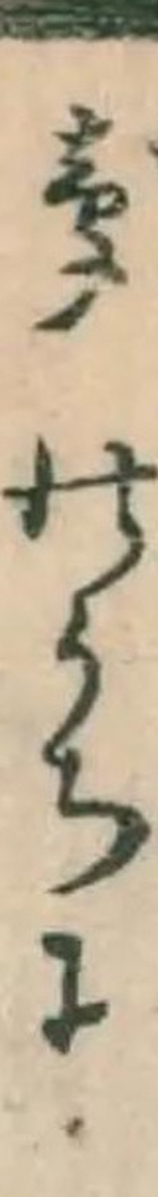夢のうちに
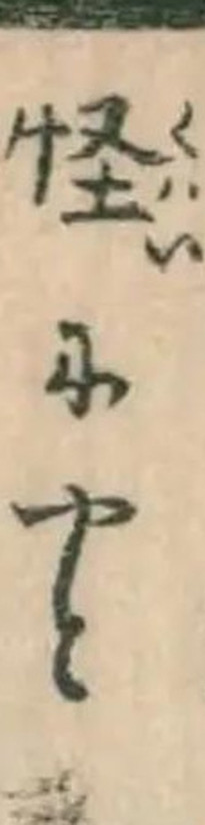怪にやと
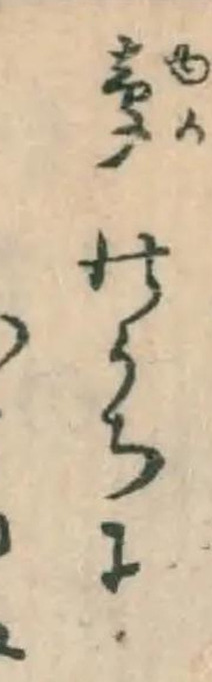夢のうちに
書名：百鬼徒然袋 3巻. [1]
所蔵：国立国会図書館 National Diet Library, JAPAN
